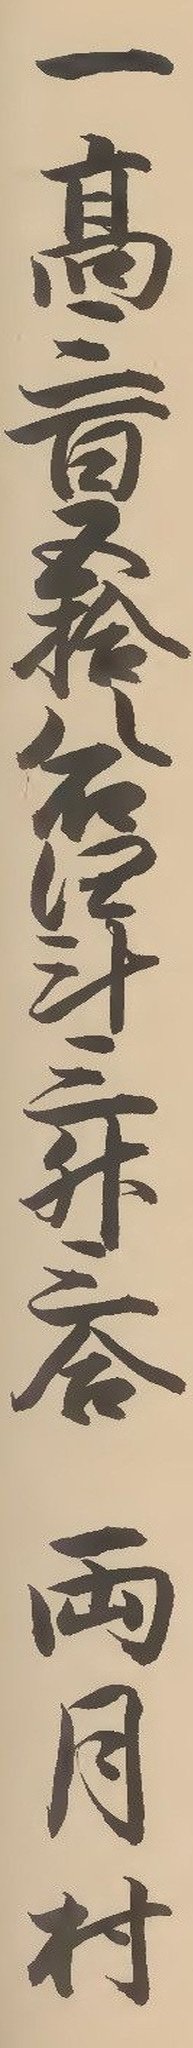一髙三百五拾八石四斗三升三合両月村
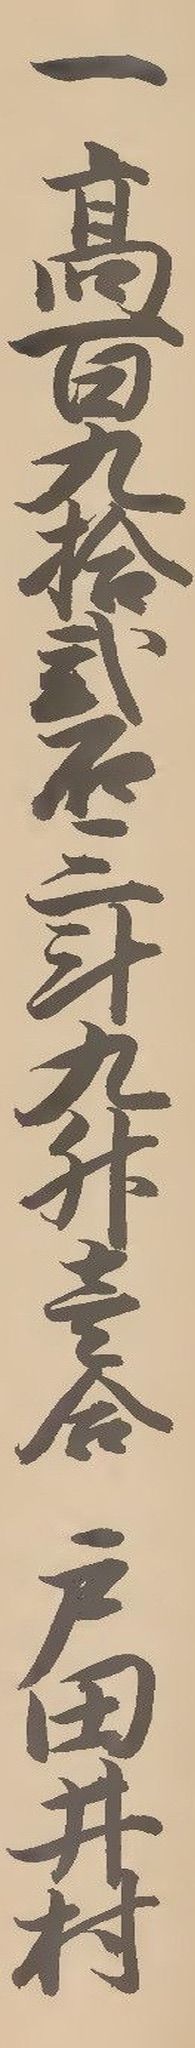一髙百九拾弐石三斗九升壱合戸田井村
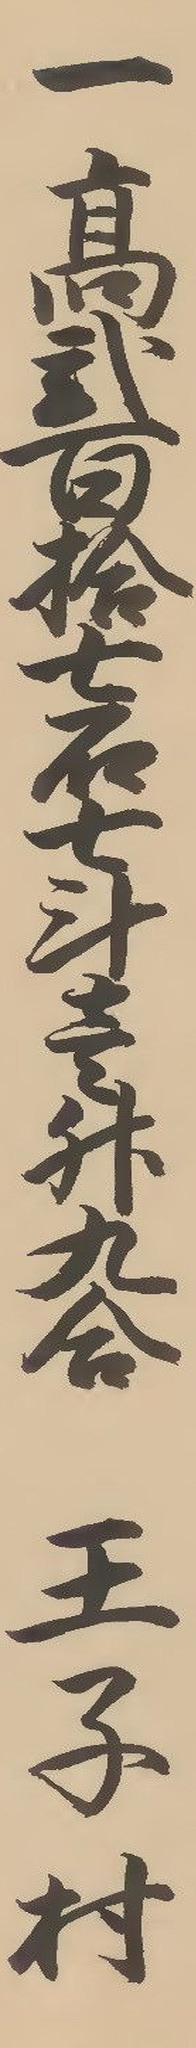一髙弐百拾七石七斗壱升九合王子村
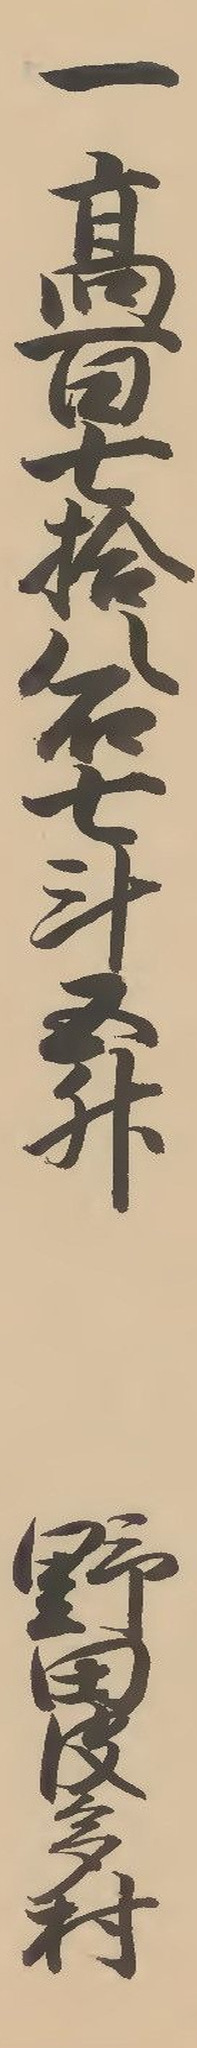一髙百七拾八石七斗五升野田皮多村
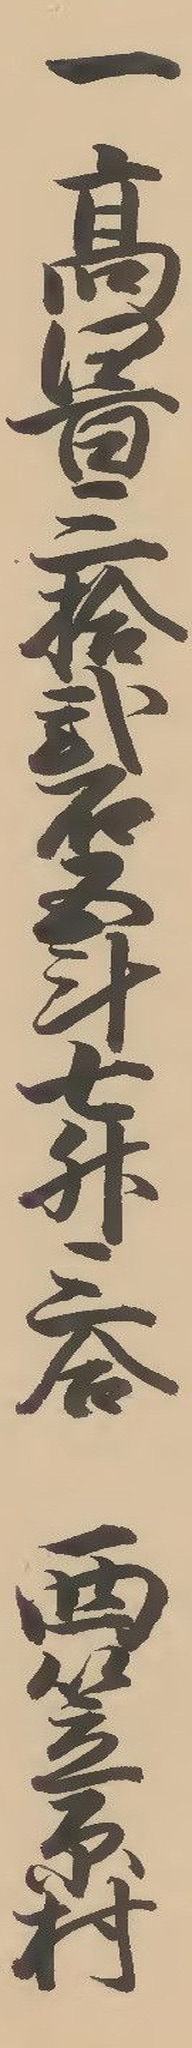一髙四百三拾弐石五斗七升三合西笠原村

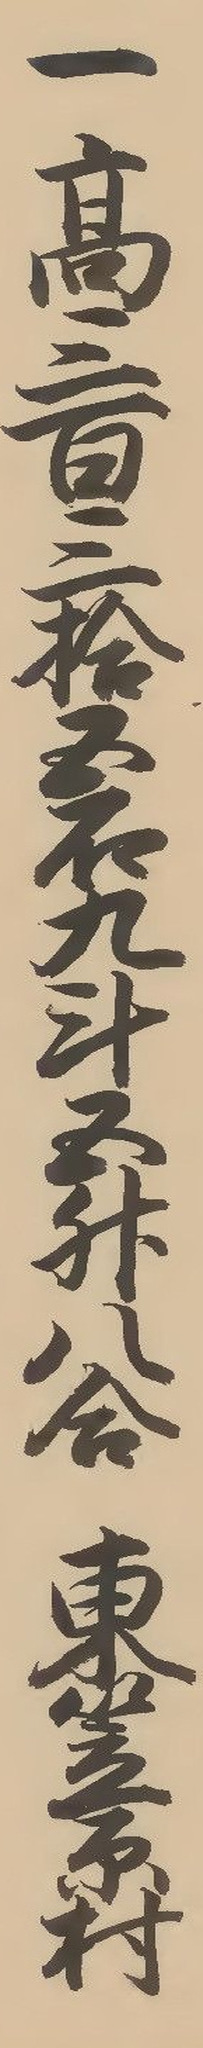一髙三百三拾五石九斗五升八合東笠原村
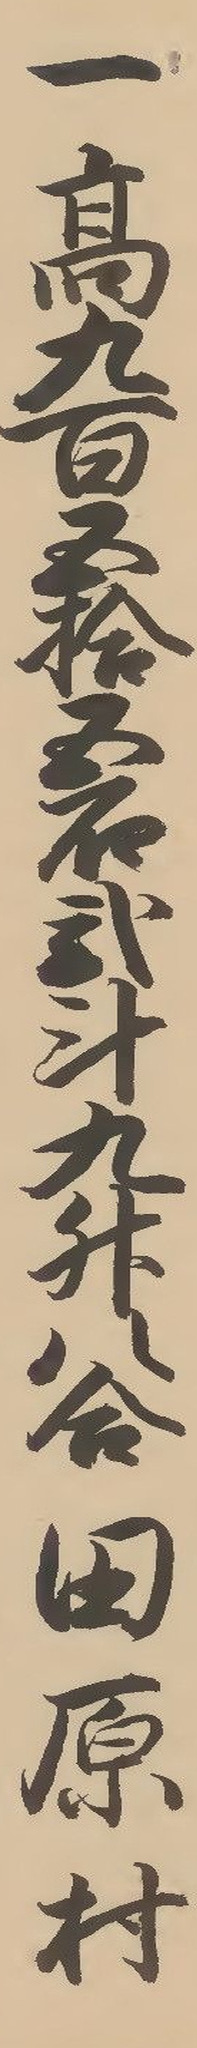一髙九百五拾五石弐斗九升八合田原村
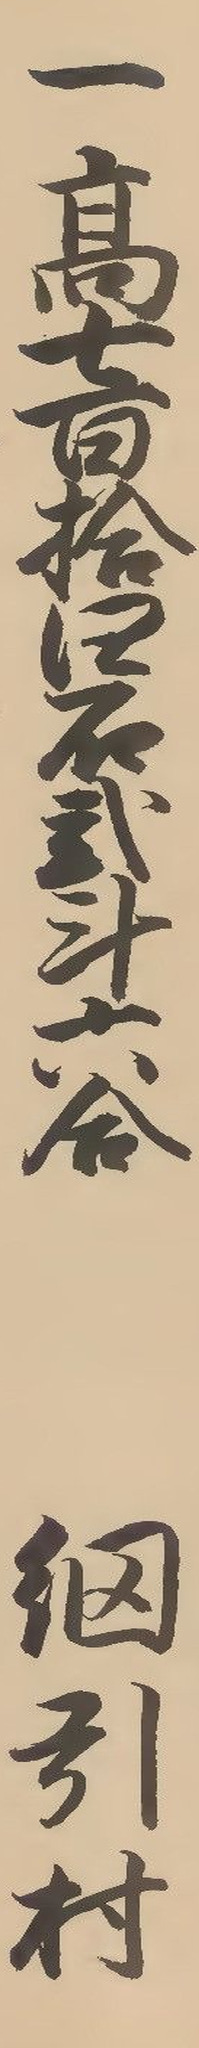一髙七百拾四石弐斗六合網引村
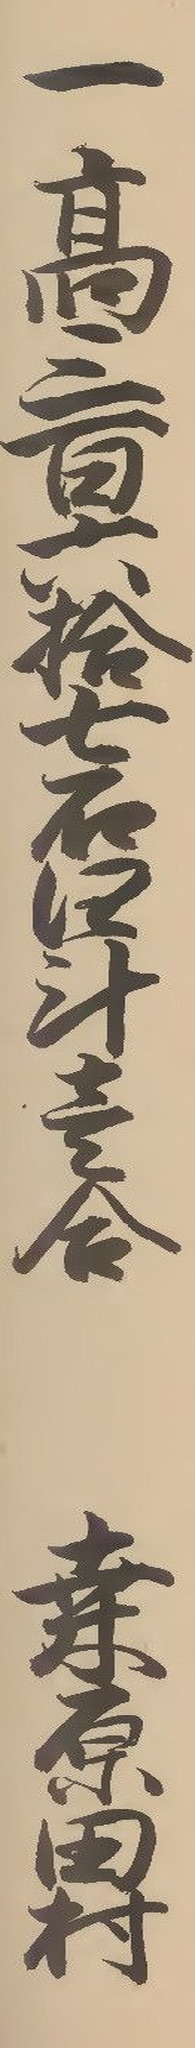一髙三百六拾七石四斗壱合桑原田村
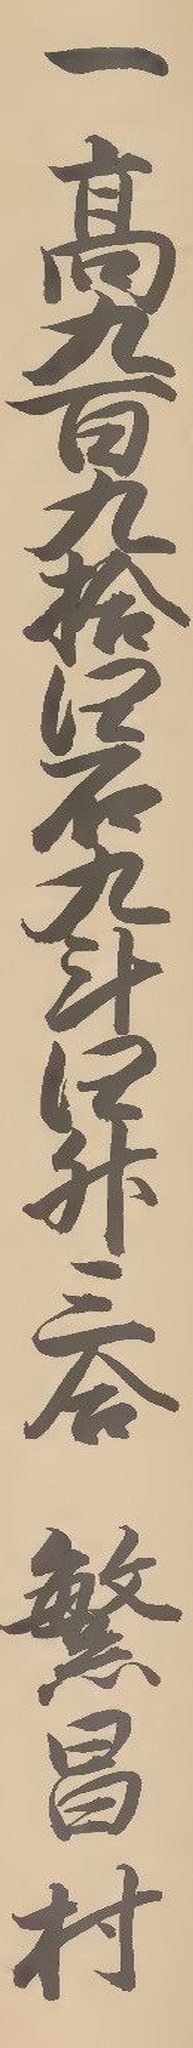一髙九百九拾四石九斗四升三合繁昌村
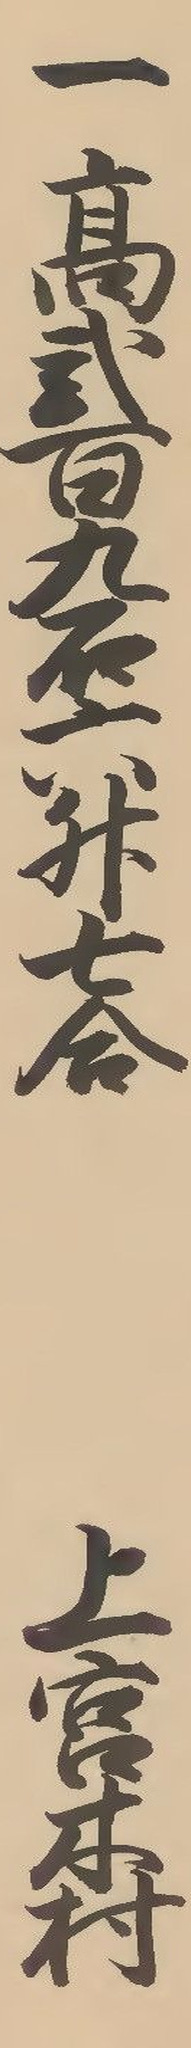一髙弐百九石六升七合上宮木村
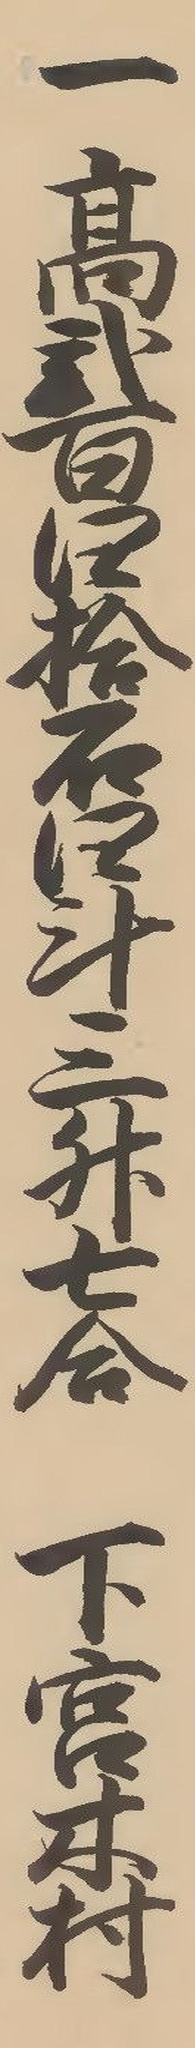一髙弐百四拾石四斗三升七合下宮木村
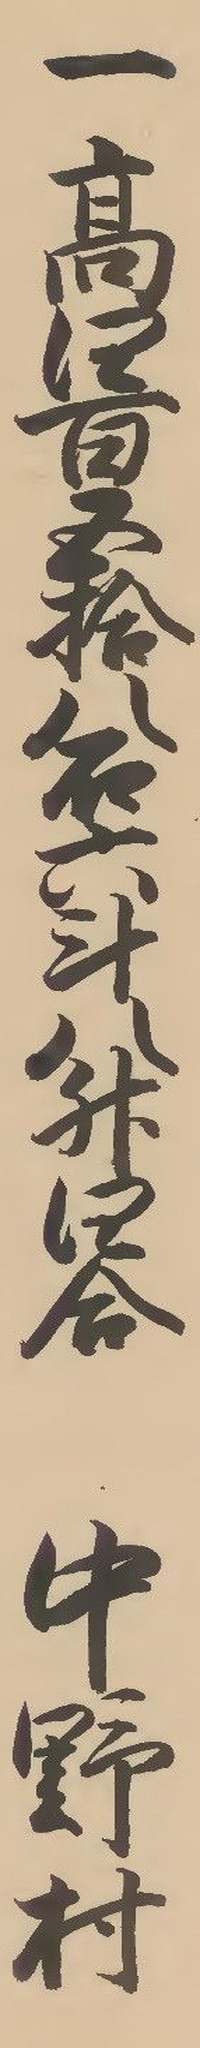一髙四百五拾八石六斗八升四合中野村

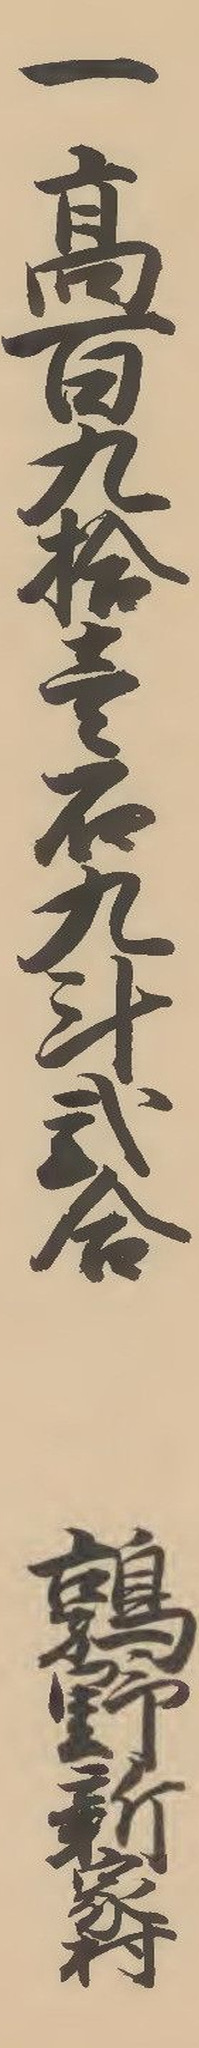一髙百九拾壱石九斗弐合鶉野新家村
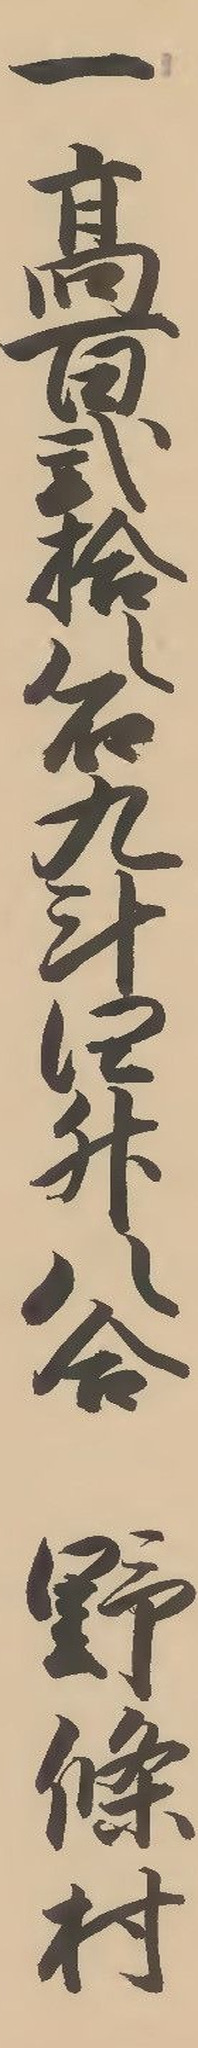一髙百弐拾八石九斗四升八合野條村
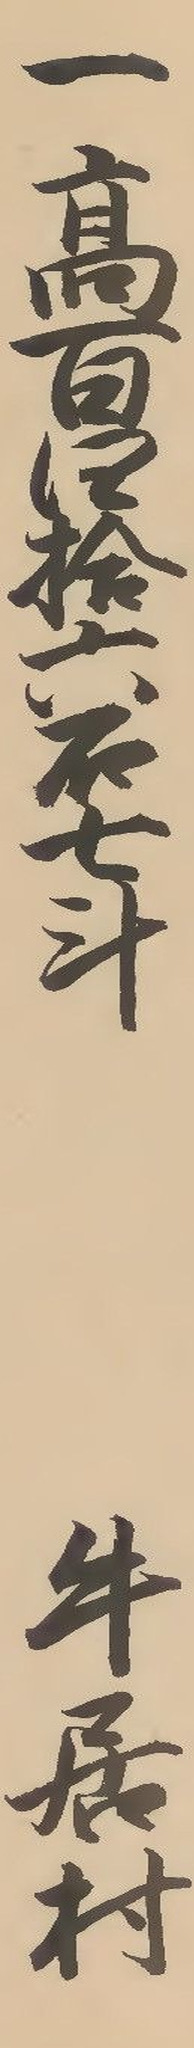一髙百四拾六石七斗牛居村
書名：播磨国郷帳
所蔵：国立公文書館 National Archives of Japan
